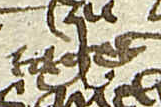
tages
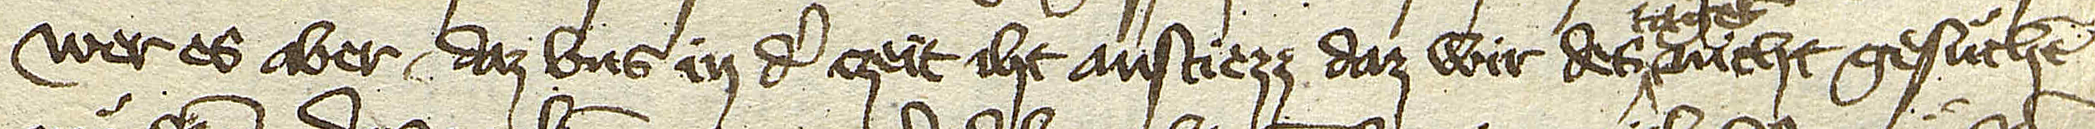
wer es aber / daʒ vns in d* cʒeit iht anſtieʒʒ daʒ wir des nicht geſüche*
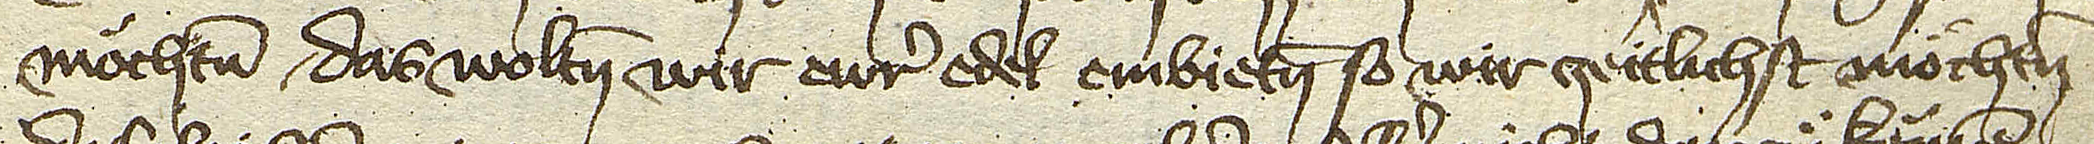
möchtn* / das woltn* wir ewr* edel embietn* ſo wir cʒeitlichſt möchtn*
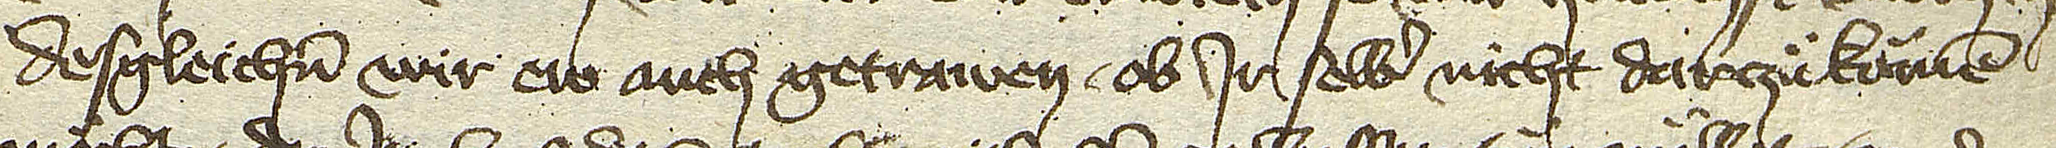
deſgleichn* wir ew auch getrawen / ob Ir ſelb* nicht darcʒü köme*
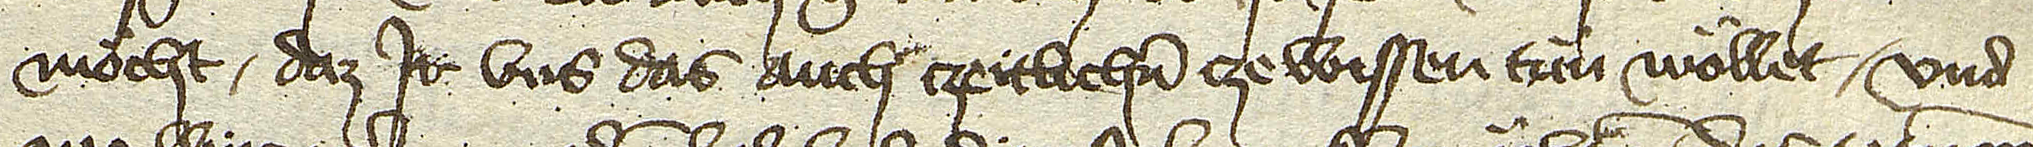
möcht / daʒ Ir vns das auch cʒeitlichn*cʒewiſſen tün wöllet / vnd
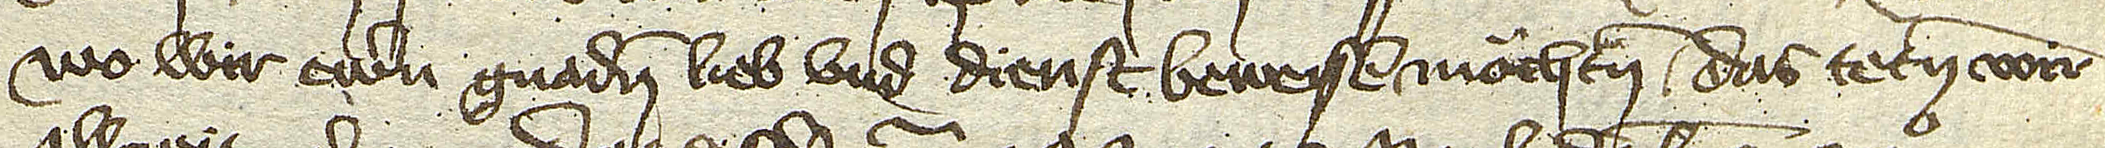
wo wir ew*n gnadn* lieb vnd dienſt beweiſe* möchtn* / Das tetn* wir
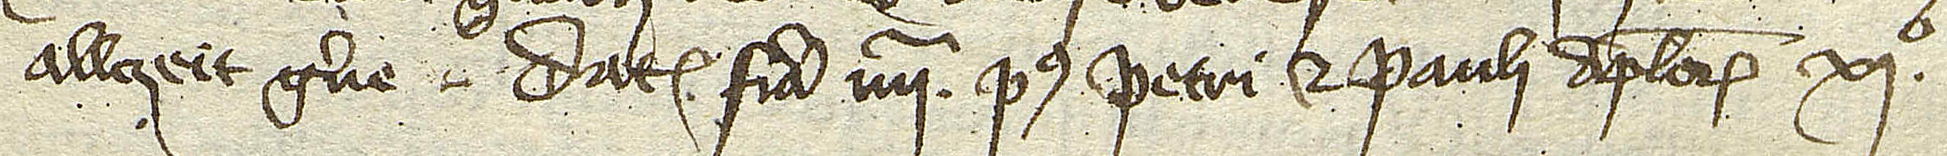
allcʒeit g*ne Dat* fia* iiii*. p* Petri @ Pauli Aplo* xi* .
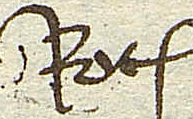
Rot*
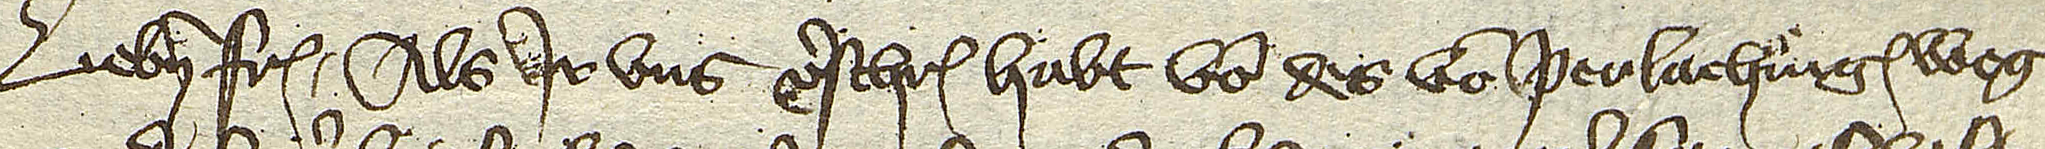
Liebn* fr* / Als Ir vns v*ſchr* habt vo* des vo* Perlaching* weg*
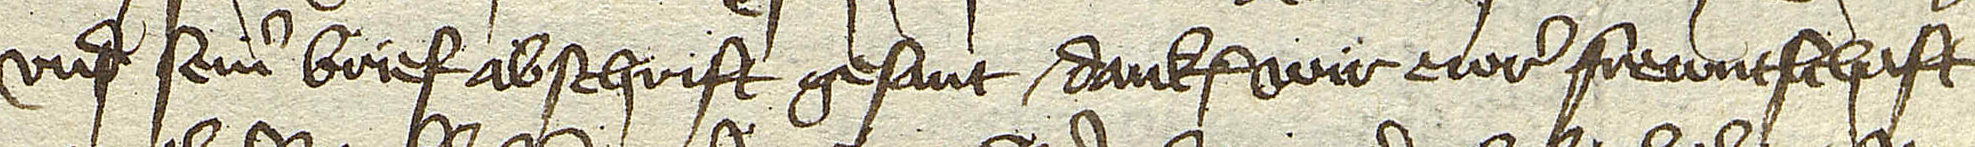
vnd ſein* brief abſchrift geſant / dank* wir ewr* frewntſchaft
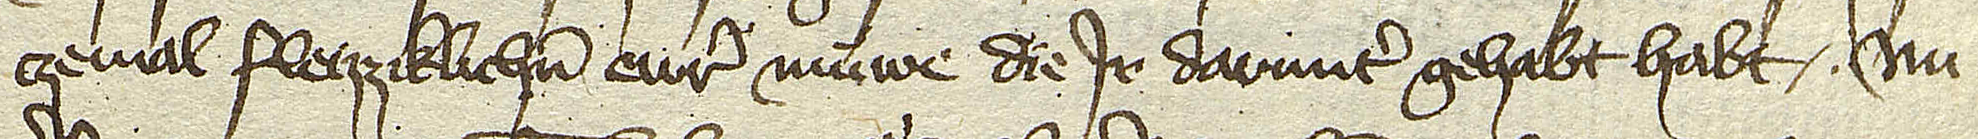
cʒemal fleiʒʒiklichn* ewr* müwe die Ir darint* gehabt habt / . Nu
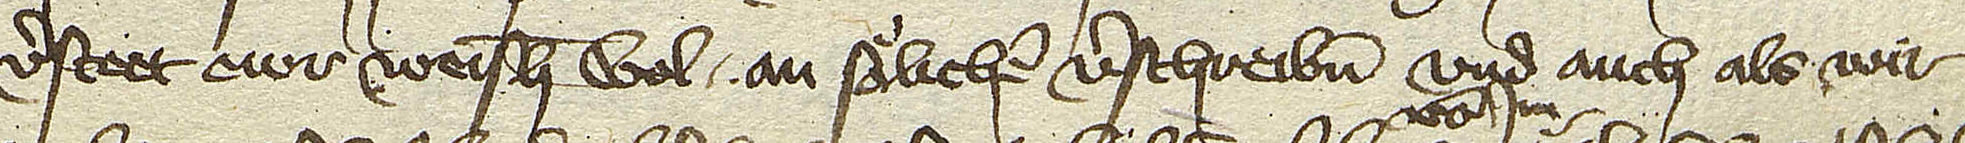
v*ſteet ewr weiſh* wol / an ſöliche* v*ſchreibn* vnd auch als wir
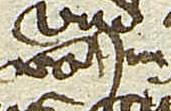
vo* Im
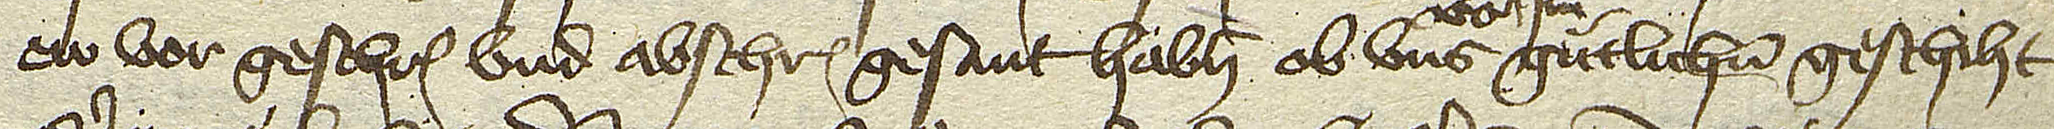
ew vor geſchr* vnd abſchr* geſant habn* ob vns gütlichn* geſchiht
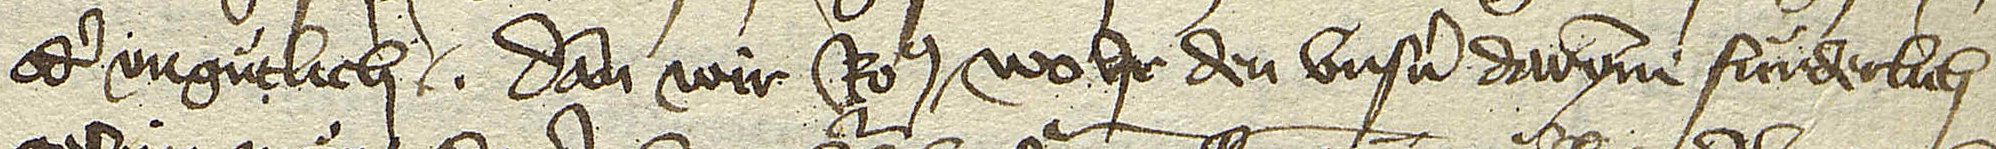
od* vngütlich / . dan* wir Ro* / wo Ir den vnſn* daryne* fürderlich
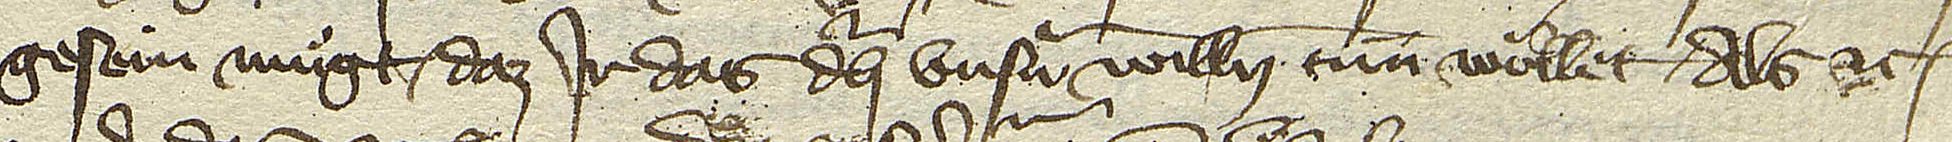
geſein mügt / daʒ Ir das d*h vnſn* willn* tün wöllet / Als ec*
